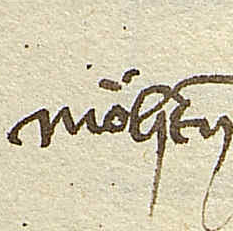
möhtn*
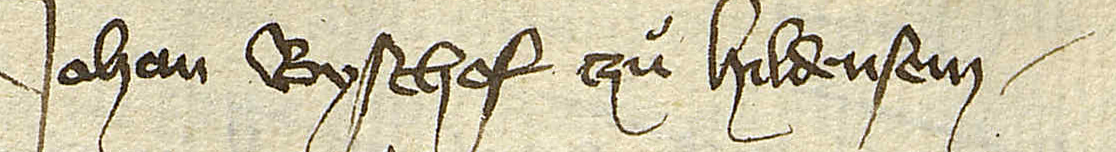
Iohan Byſchof cʒü Hildenſein /
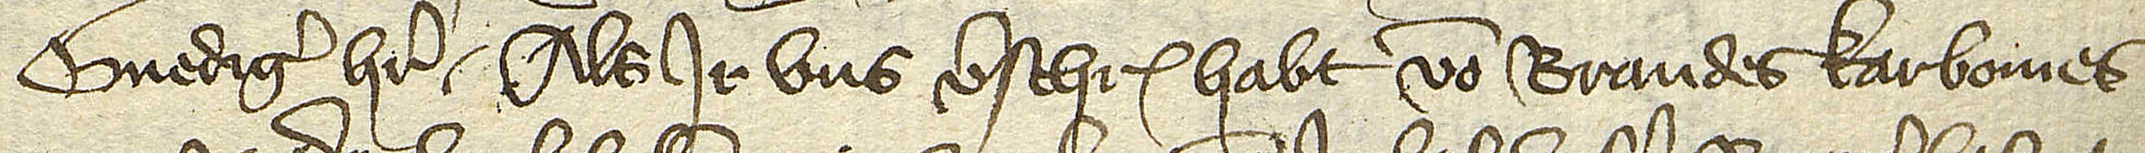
Gnedig* hr* / Als Ir vns v*ſchr* habt vo* Brandes Karbomes
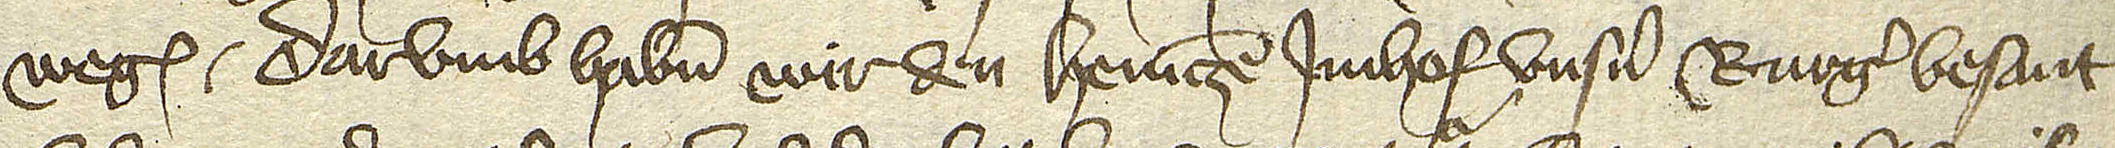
weg* / Darvmb habn* wir den Heincʒe* Imhof vnſn* Burg* beſant
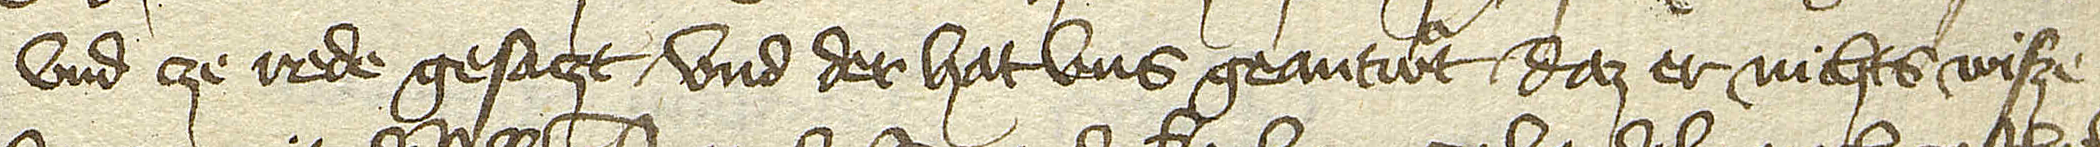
vnd cʒe rede geſacʒt / vnd der hat vns geantwt* / daʒ er nichts wiſʒe
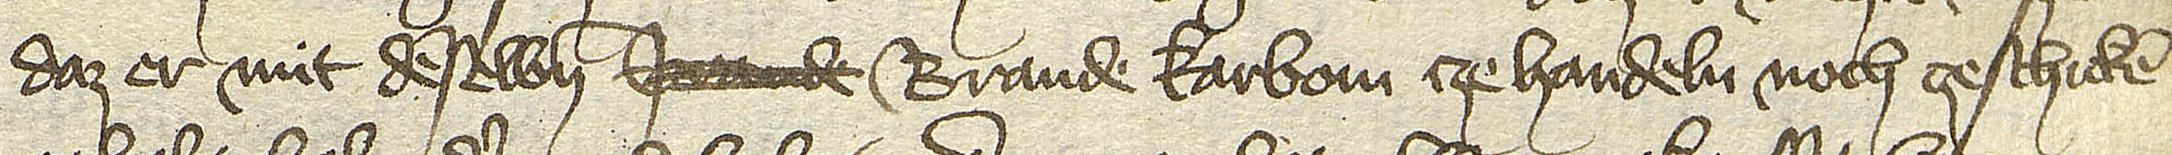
daʒ er mit de*ſelbn* Prande Brande Karbom cʒe handeln noch cʒeſchicke*
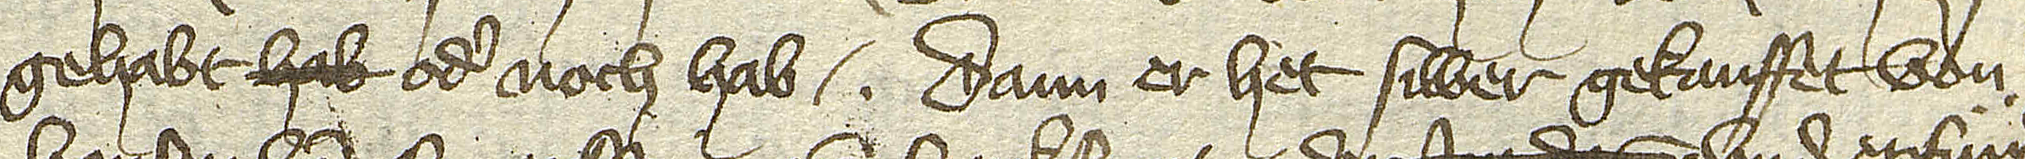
gehabt hab od* noch hab / . Dann er het ſelber gekauffet von
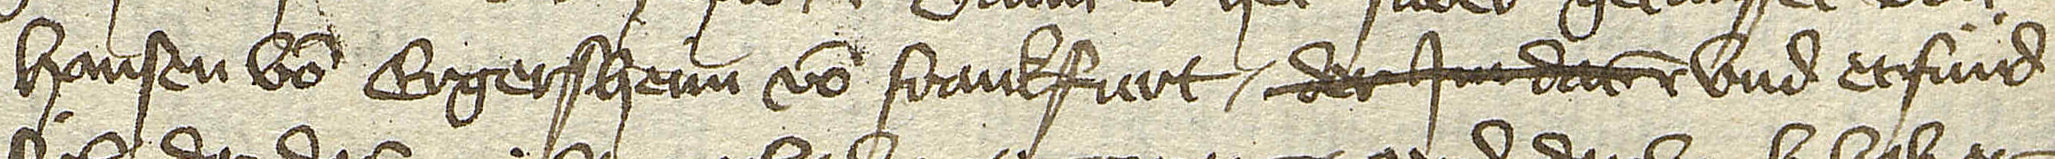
hanſen vo* Ergerſheim vo* frankfurt / der Im das r vnd erfünd
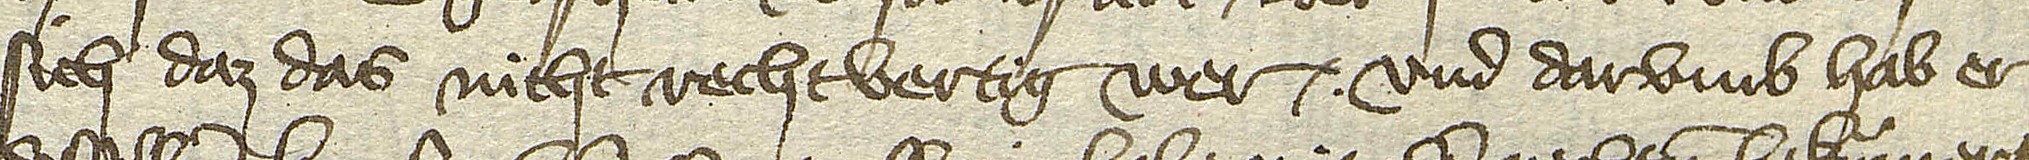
ſich daʒ das nicht rechtvertig wer / . vnd darvmb hab er
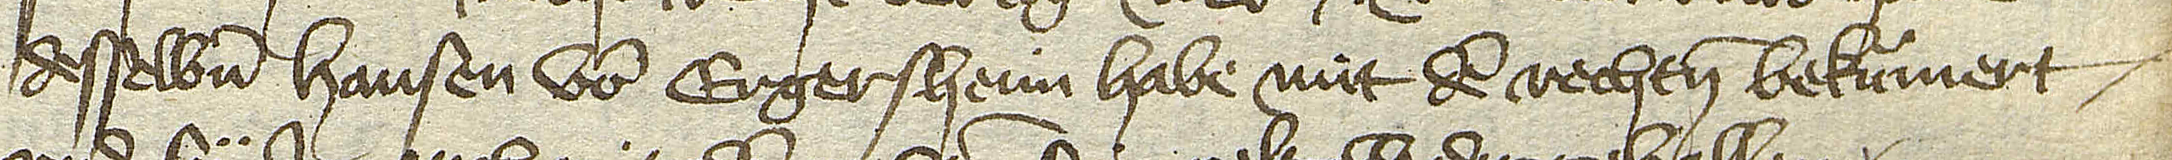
deſſelbn* hanſen vo* Ergerſheim habe mit d* rechtn* bekümert /
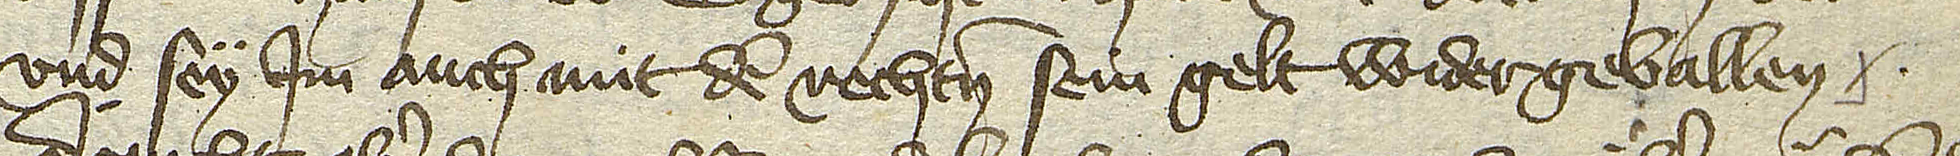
vnd ſey Im auch mit d* rechtn* ſein gelt widergevallen / .
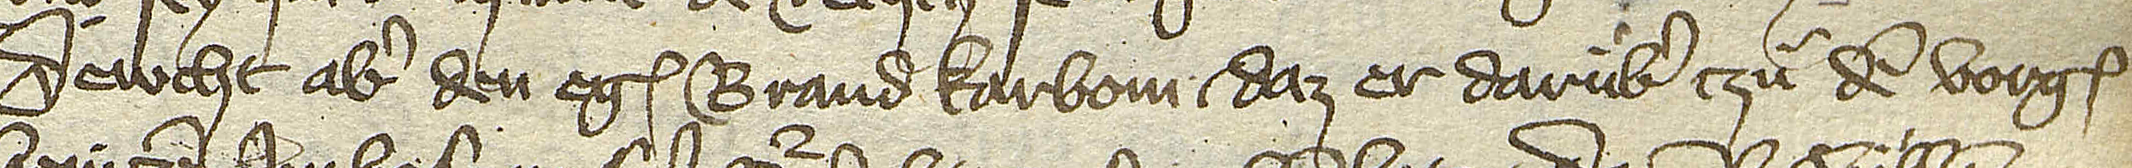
Dewcht ab* den eg* Brand Karbom / daʒ er darüb* cʒu d* vorg*
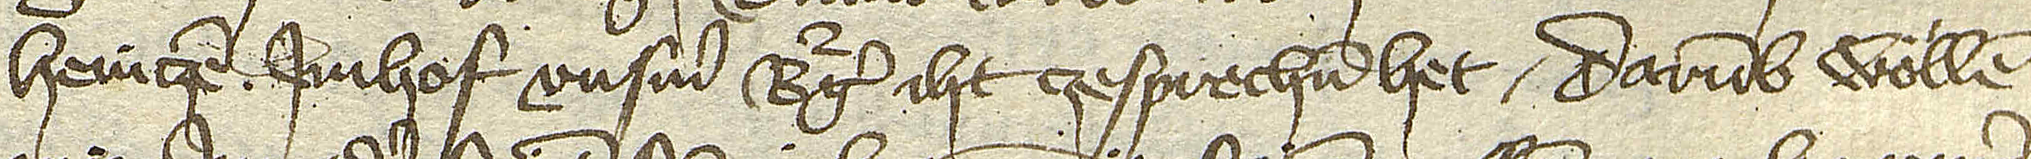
heincʒe* Imhof vnſm* B*g* iht cʒeſprechn* het / Darüb* wölle*
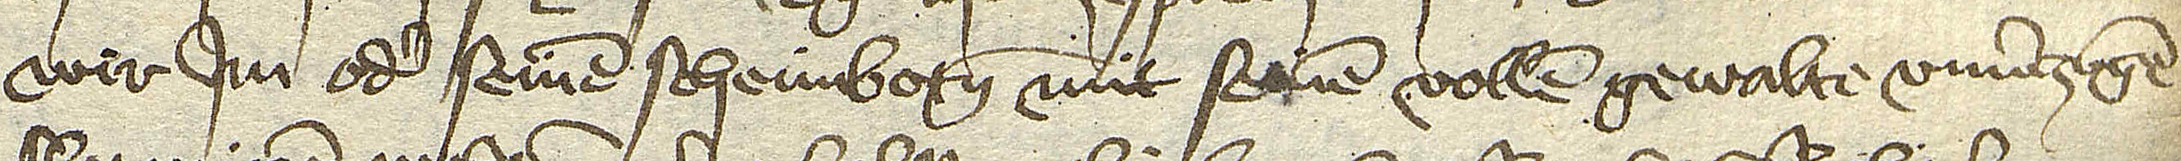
wir Im od* ſeine* ſcheimbotn* mit ſeine* volle* gewalte vnu*cʒoge*
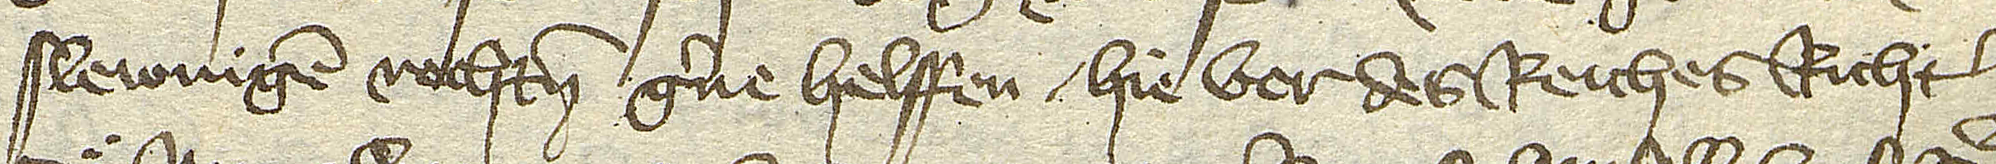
ſlewnige* rechtn* g*ne helffen / hie vor des Reiches Richt*
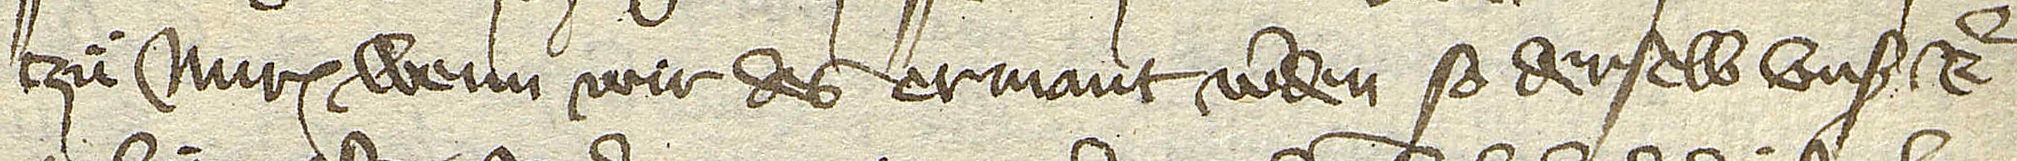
cʒü Nur* / wenn wir des ermant w*den ſo derſelb vnſ* B*
